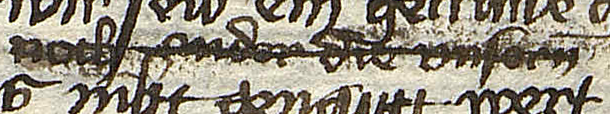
noch ander die vnſern
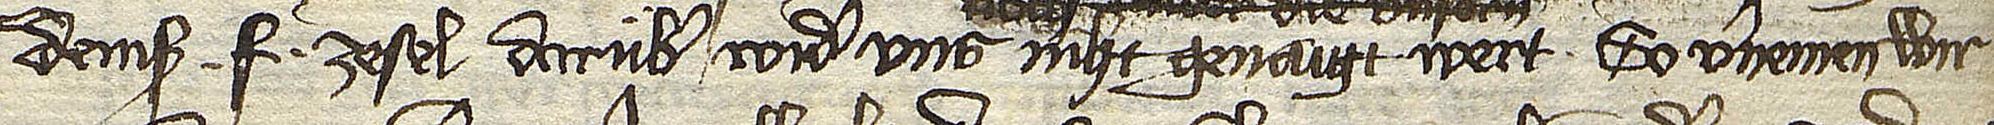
demſ* . f . ʒeſel darüb* wid* vns niht genaigt wert . So v*nemen wir
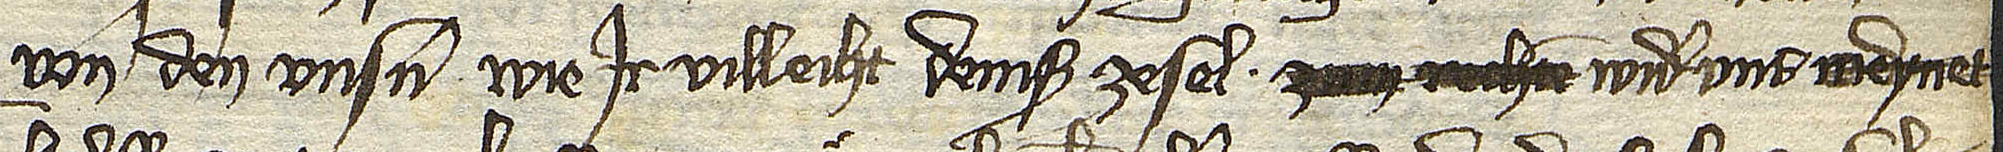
von den vnſn* wie Ir villeiht Demſ* ʒeſel . ʒum rechte* wid* vns meynet
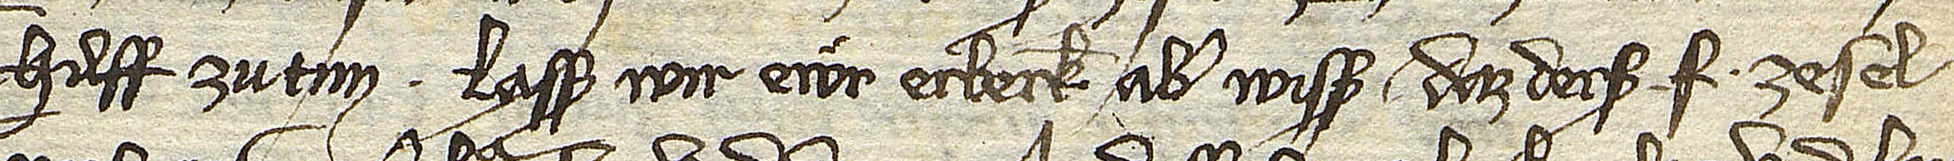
hilff ʒutun . Laſſ* wir eẅr erberk* ab* wiſſ* / daʒ derſ* . f . ʒeſel
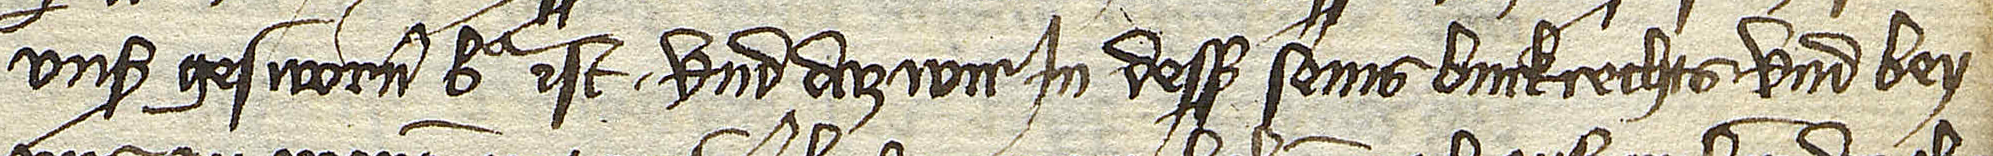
vnſ* geſworn* b* iſt / Vnd daʒ wir In deſſ* ſeins burkrechts Vnd bey
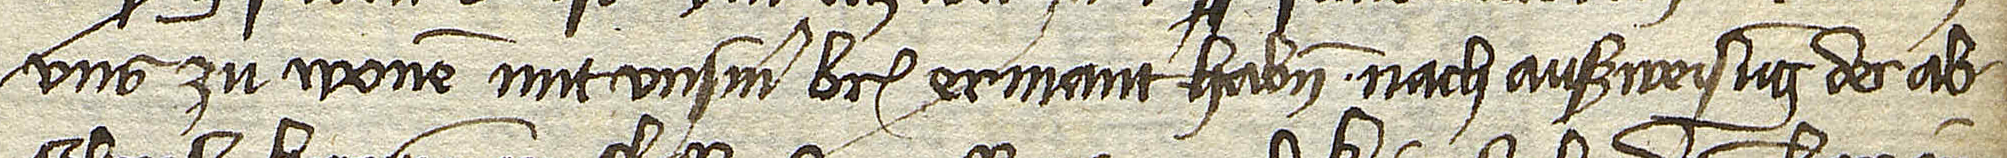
vns ʒu wone* mit vnſm* br* ermant habn* . nach auſʒweiſu*g der ab -
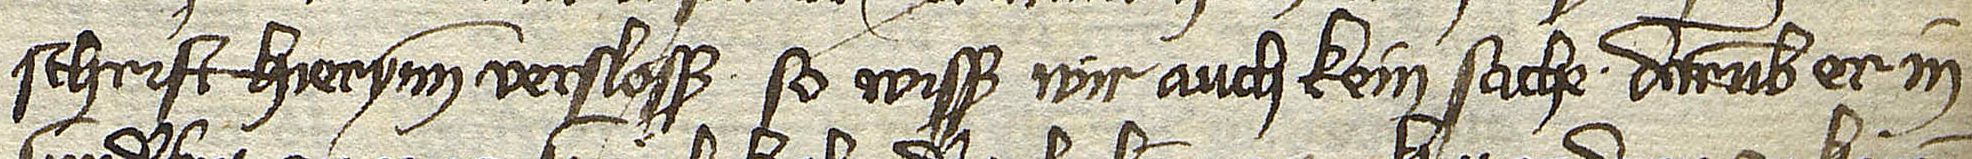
ſchrift hierynn* verſloſſ* ſo wiſſ* wir auch kein ſache . darub* er in
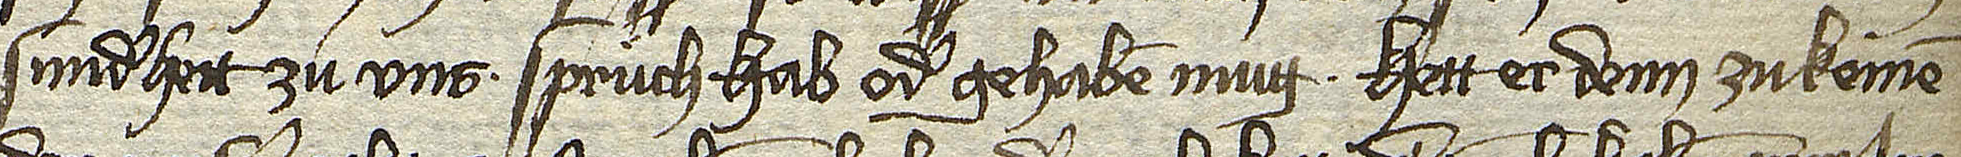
ſund*heit ʒu vns ſprüch hab od* gehabe* mug . Hett er denn ʒu keine*
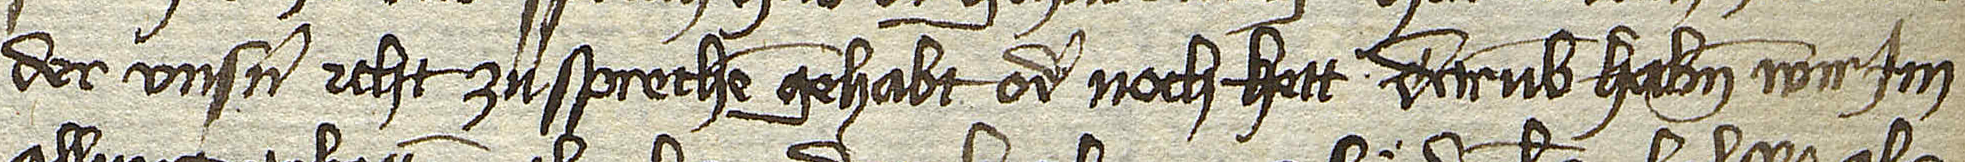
der vnſn* icht ʒuſpreche* gehabt od* noch hett . Darub* habn* wir Im
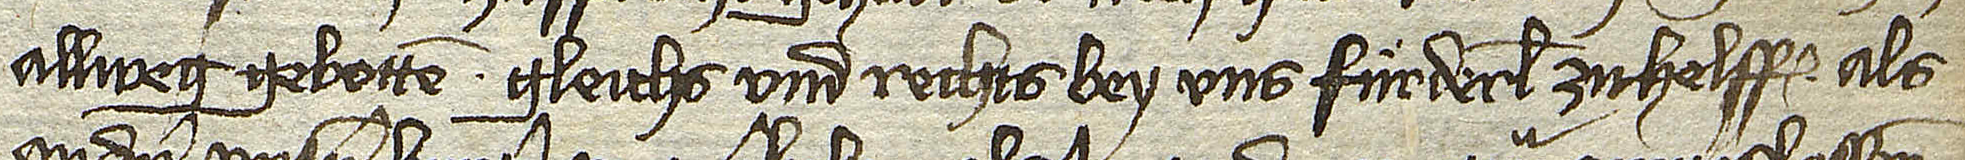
allweg gebotte* . gleichs vnd rechts bey vns fürderl* ʒuhelff* . als
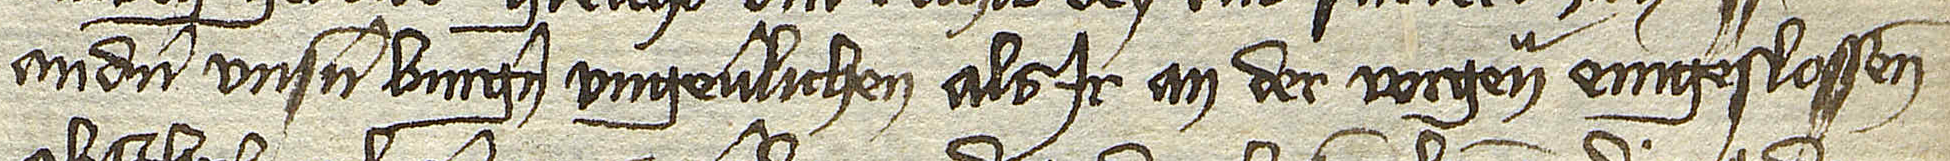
andn* vnſn* burg*n vngeu*lichen als Ir an der vorgen* eingeſloſſen*
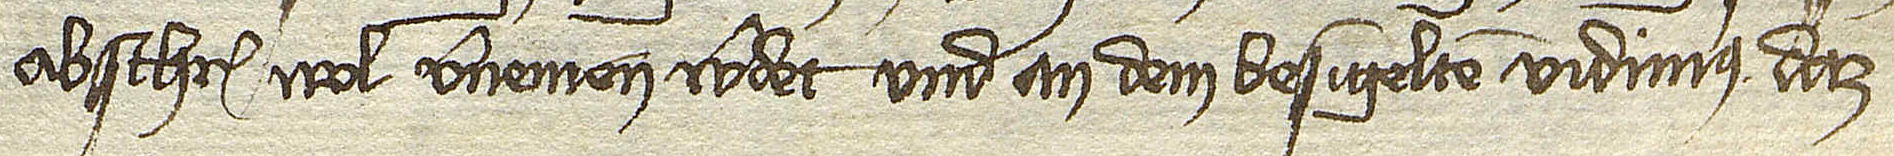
abſchr* wol v*nemen w*det vnd an dem beſigelte* vidim* . daʒ
